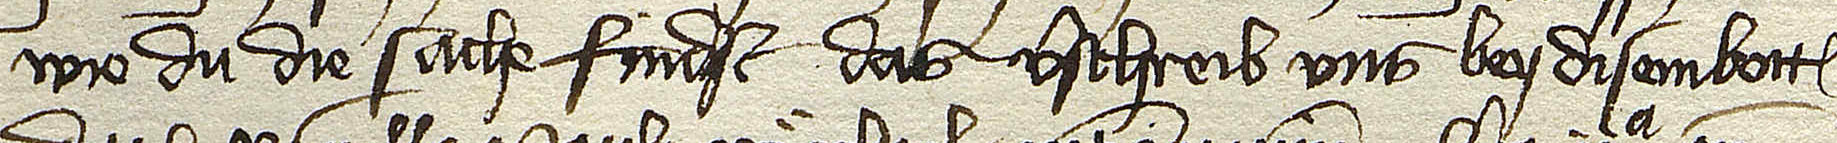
wie du die ſache findſt das v*ſchreib vns bey diſem bott*
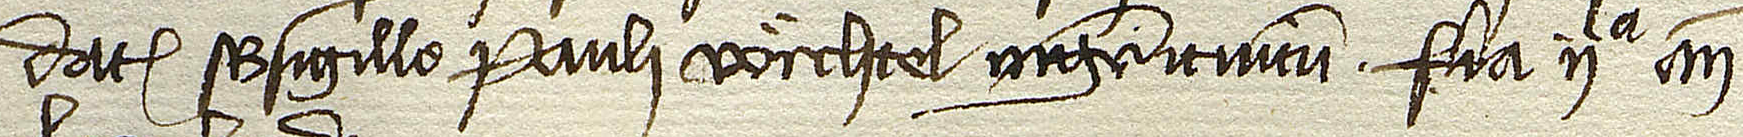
dat* ſ*B ſigillo Pauli vörchtel m*g*ri*ciuiu* . fia* ii* an*
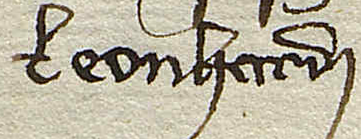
Leonhardi
